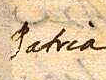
Patria
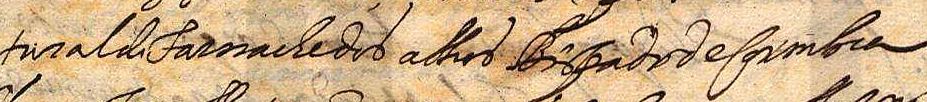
tural de Sarnache dos alhos Bispado de Coimbra
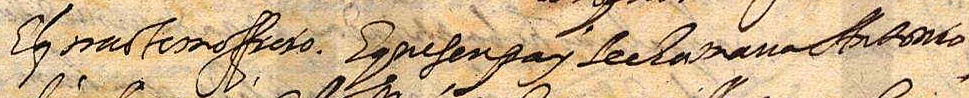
E q̄ naõ tem officio. E que seu pay se chamaua Antonio
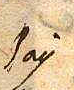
Pay
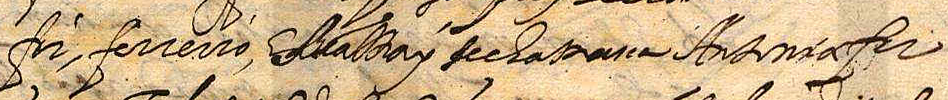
frz̄, ferreiro, E sua May se chamaua Antonia frz
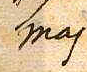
maj
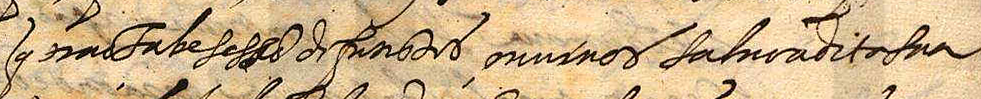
q̄ naõ sabe se saõ defunctos, ou uiuos saluo a dita sua
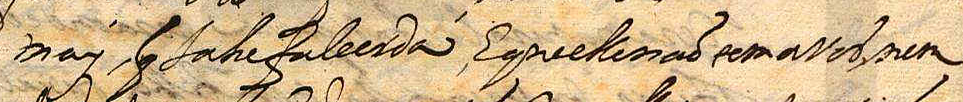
may, q̄ Ia he falecida, E que elle naõ tem avos, nem
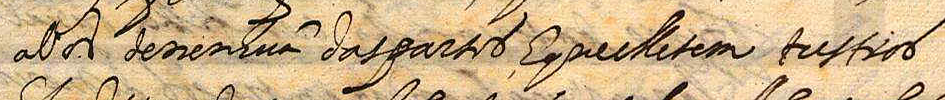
avos de nenhuā das partes, E que elle tem tres tios
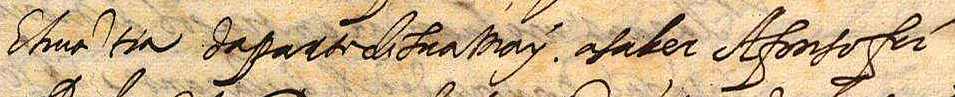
E huā tia da parte de sua may. a saber Afonso frz̄
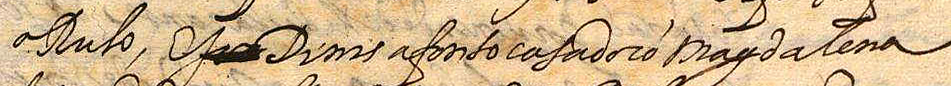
o Rulo, E Jo Dinis afonso casado cō Magdalena
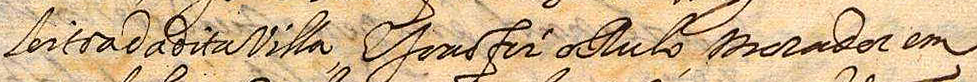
Leitoa da dita Villa, E João frz̄ o Rulo, morador em
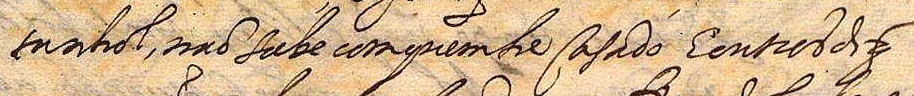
tanhol, naõ sabe com quem he Casado E outros de q̄
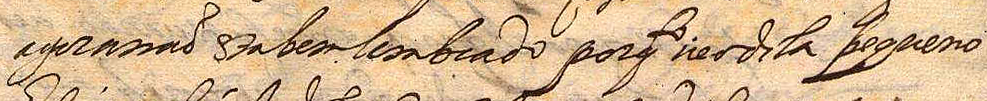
agora naõ esta bem lembrado porq̄ ueo de la pequeno
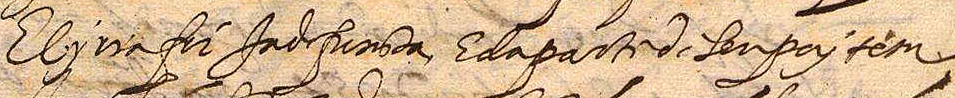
E Eyria frz̄ Ja defuncta, E da parte de seu pay tem
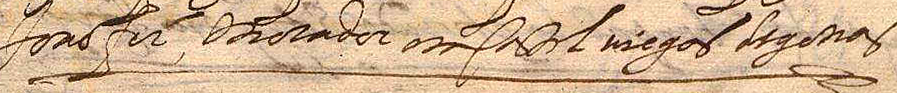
João frz̄, morador em Castel uiegas digo nas
